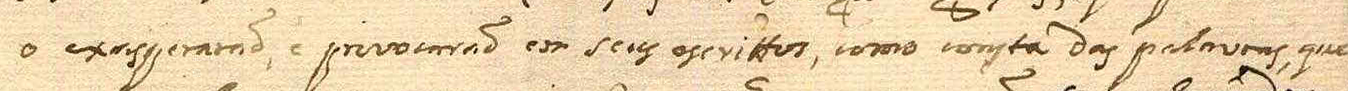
o exasperaraõ, e provocaraõ em seus escrittos, como consta das palavras, que
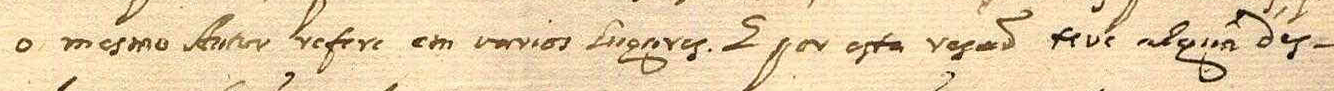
o mesmo Autor refere em varios lugares. E por esta resaõ teve alguā des
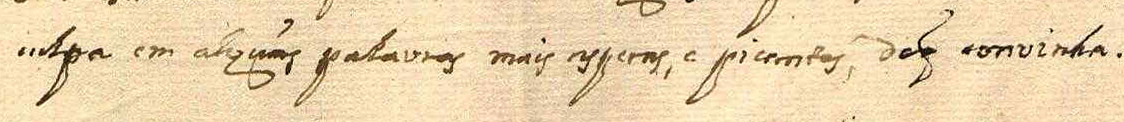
culpa em alguās palavras mais asperas, e picantes, do q̄ convinha.
